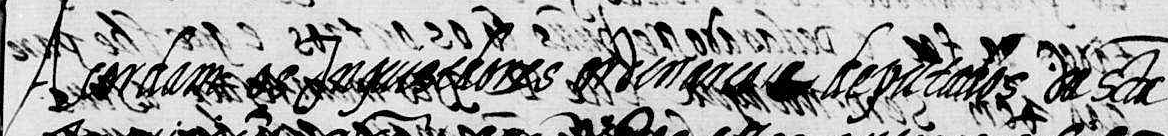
Acordam os Jnquisidores ordinarios e deputados da sct̄a
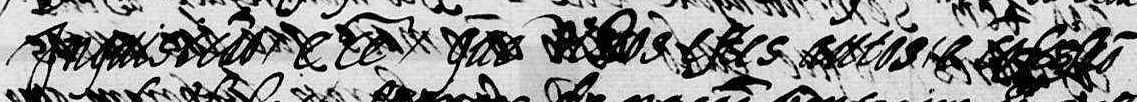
Jnquisição & cē que vistos estes autos e cōfissaõ
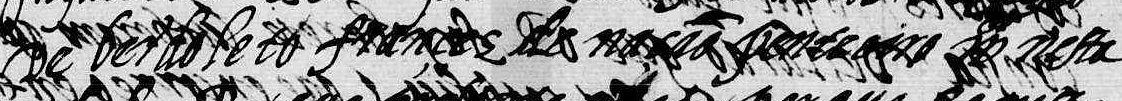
De berdoleto frances de naçaõ penteeiro mor nesta
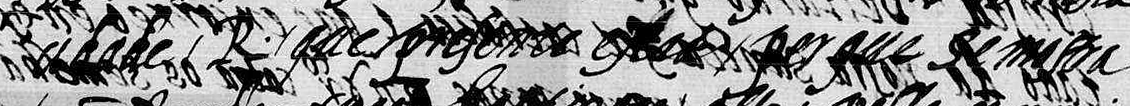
cidade / R / que presente esta / per que se mostra
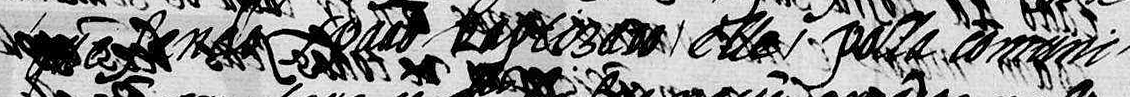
que sendo xpaão baptizado elle polla comuni
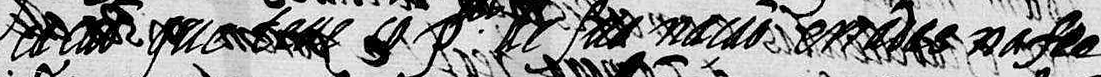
caçaõ que teue cō p.as de sua naçaõ erradas na fee
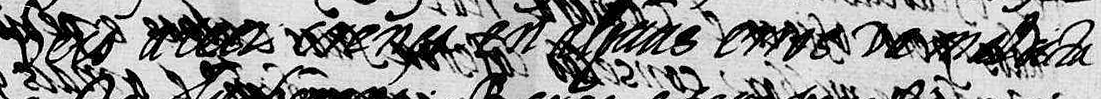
veio a ter crença en algūus erros da maldicta
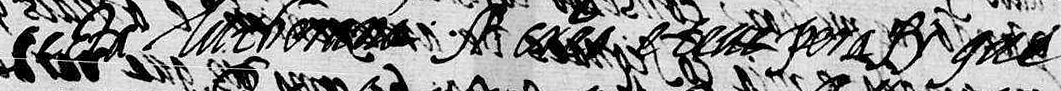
secta lutherana _ creo e teue pera sy que
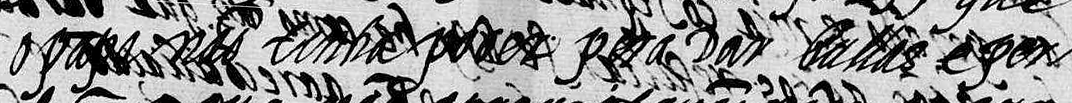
o papa naõ tinha poder pera Dar bullas e per
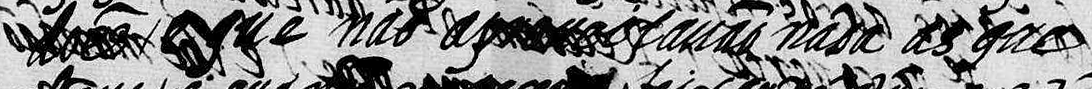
doẽs / e que naõ aproueitauão nada as que
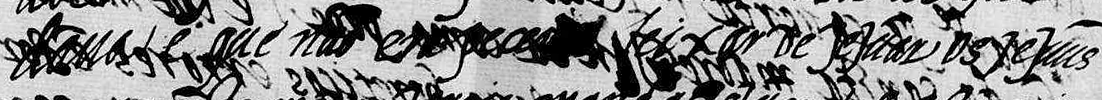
daua e que naõ era pecca_ leixar De JeJuar os JeJuūs
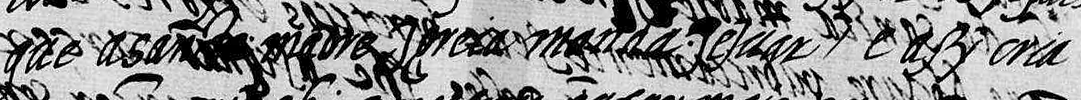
que a sancta madre Jgreia manda JeJuar / e asy cria
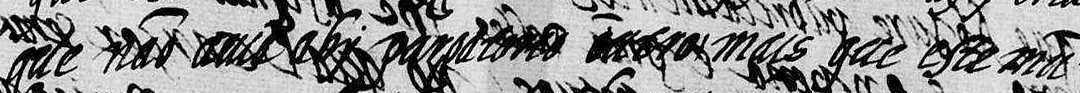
que naõ auia ahy porgatorio outro mais que este mū
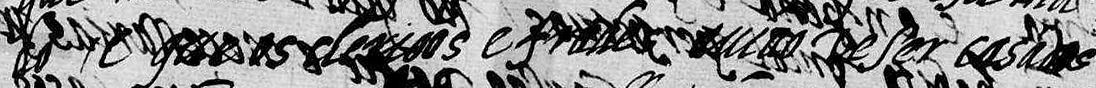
do e que os clerigos e frades auiaõ De ser casados
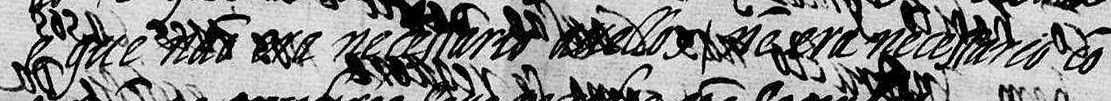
e que naõ era necessario auello e nē era necessario cō
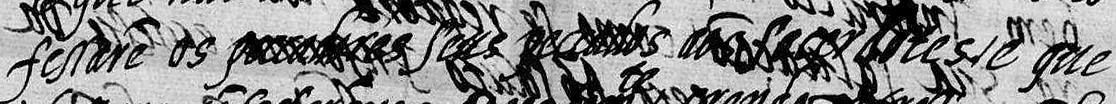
fessarē os peccadores seus peccados aos sacerdotes / e que
